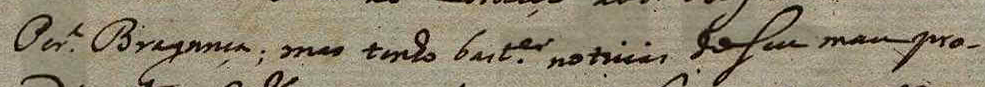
Per.a Bragança; mas tenho bast.es noticias do seu mau pro
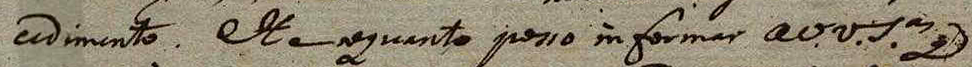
cedimento. He o quanto posso informar a V. V. S.as q̄
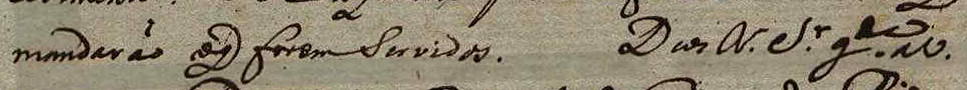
mandarão o q̄ forem servidos. Deos N. S.r g.de a v.
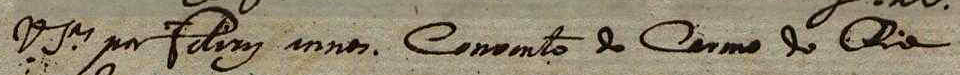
V. S.as por felizes annos. Convento do Carmo do Rio
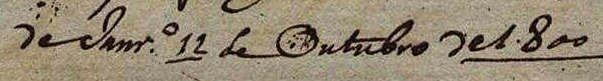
de Ianr.o 12 de Outubro de 1.800
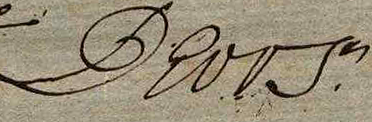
DE V V. S.as
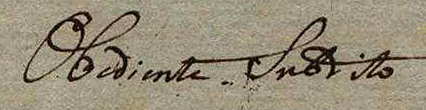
Obediente Subdito
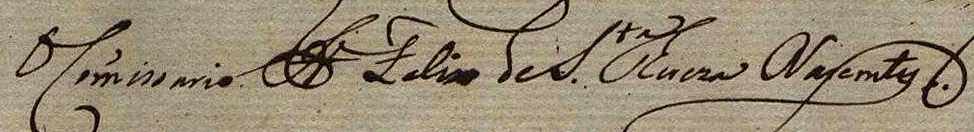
O Com̄issario Fr Felix de S.ta Thereza Nasemtes.
